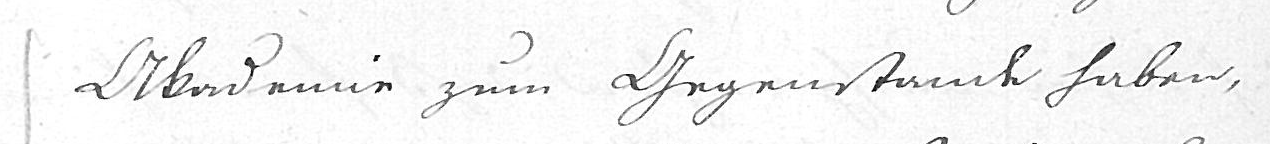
Akademie zum Gegenstand haben,
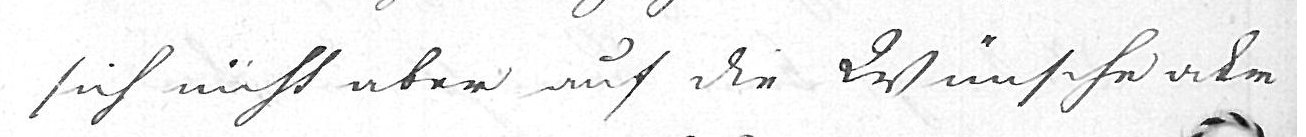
sich nicht aber auf die Wünsche oder
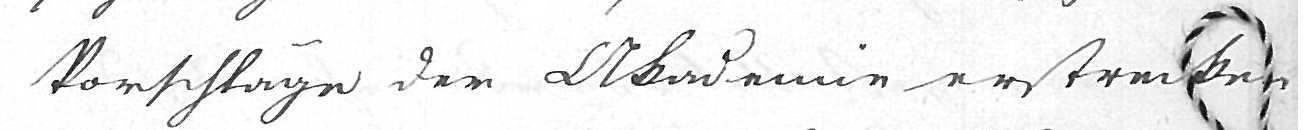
Vorschläge der Akademie erstrecken
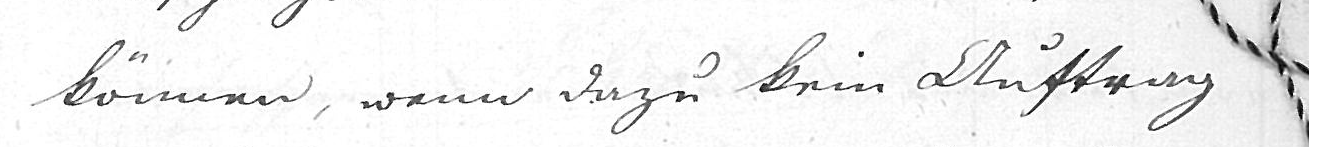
können, wenn dazu kein Auftrag
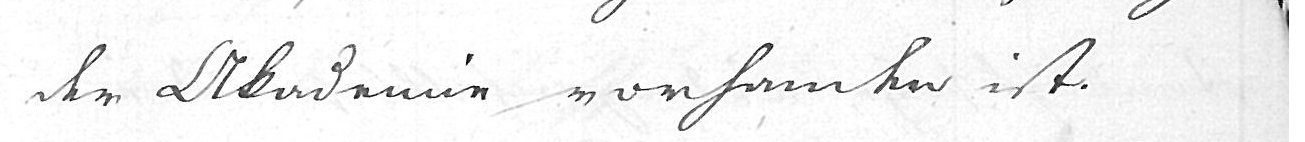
der Akademie vorhanden ist.
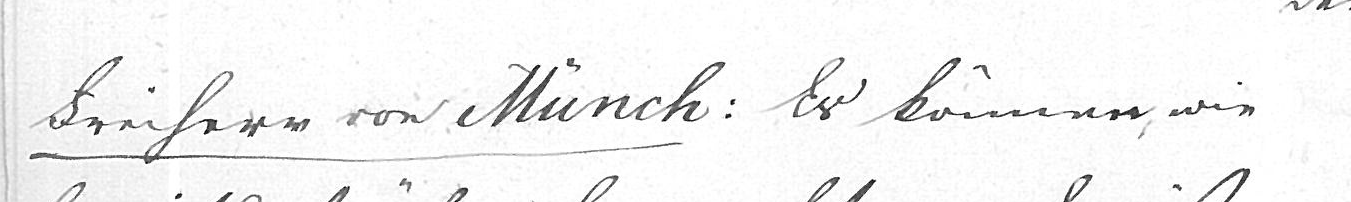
Freiherr von Münch: Es können, wie
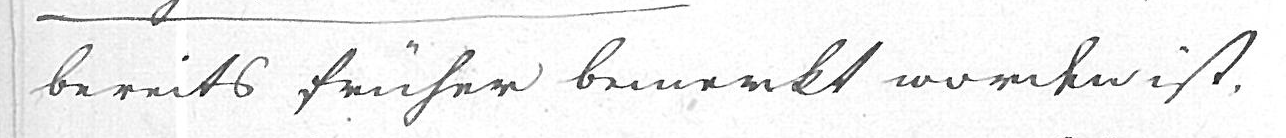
bereits früher emerkt worden ist,
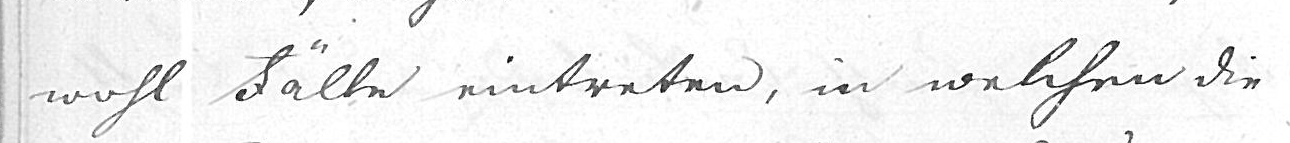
wohl Fälle eintreten, in welchen die
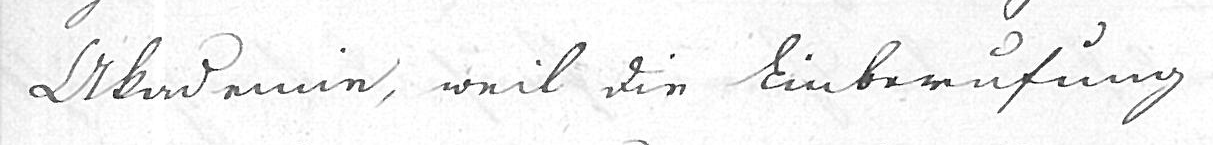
Akademie, weil die Einberufung
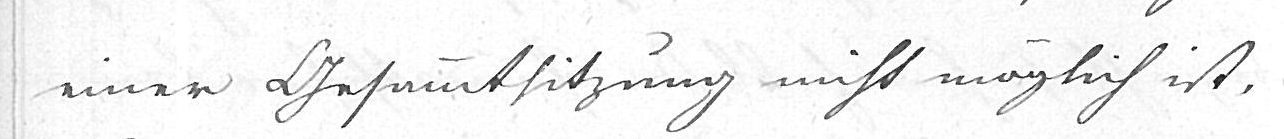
einer Gesammtsitzung nicht möglich ist,
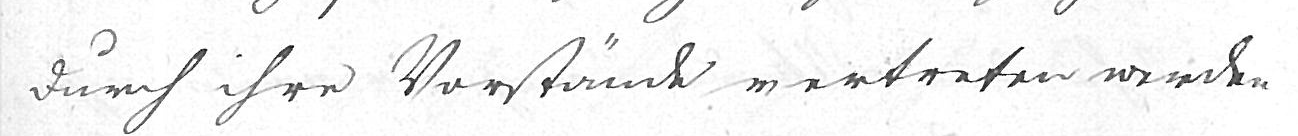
durch ihre Vorstände vertreten werden
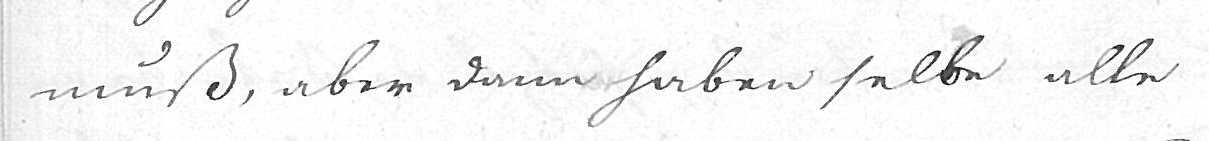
muß, aber dann haben selbe alle
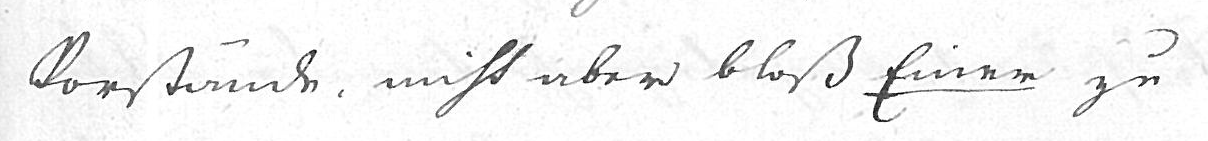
Vorstände, nicht aber bloß einer zu
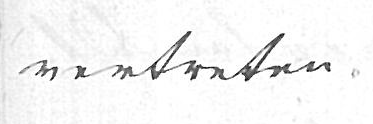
vertreten.
